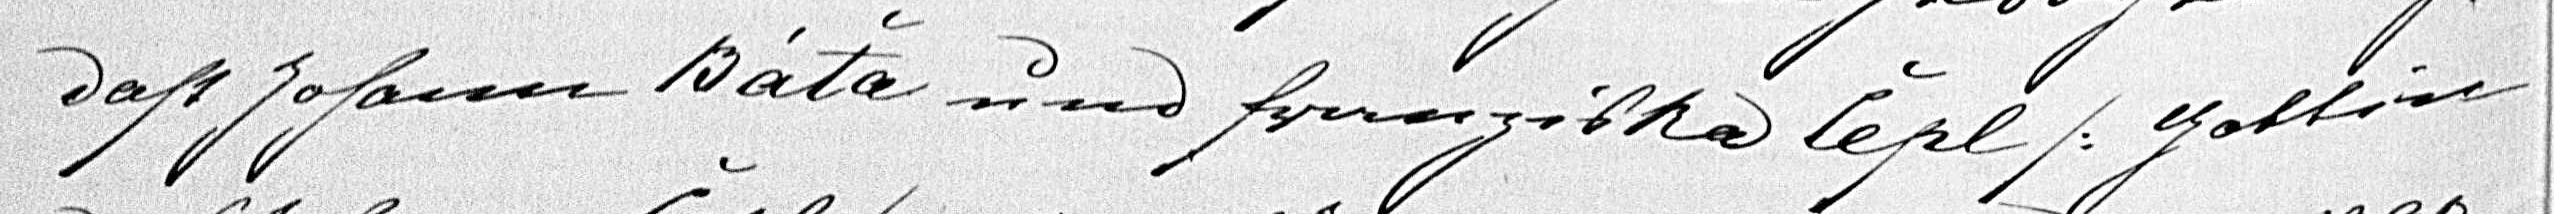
daß Johann Báta und Franziska Čepl /: Gattin
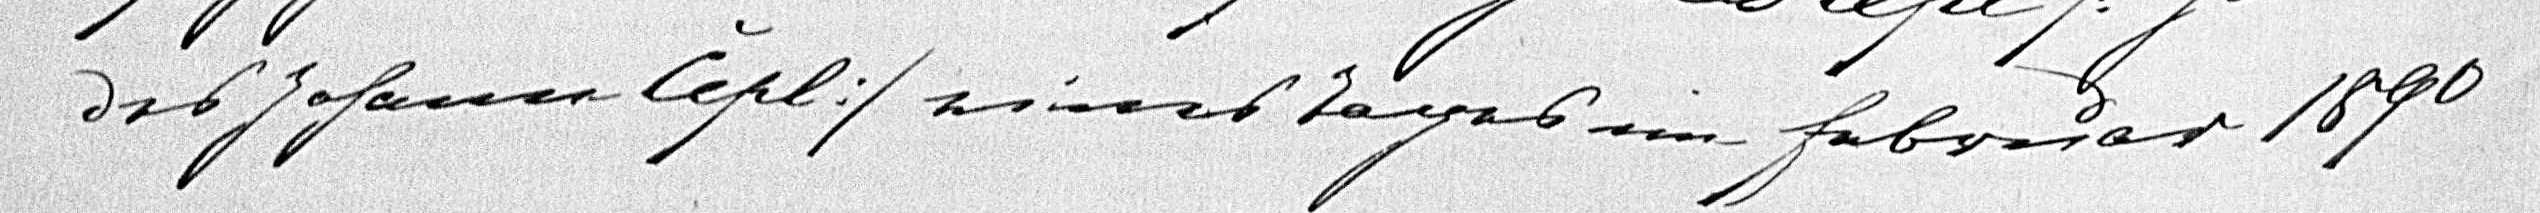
des Johann Čepl :/ eines Tages im Februar 1890
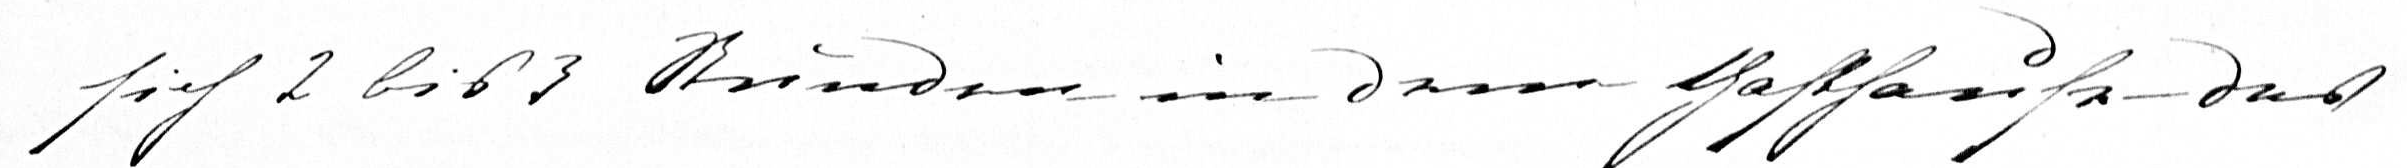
sich 2 bis 3 Stunden in dem Gasthause des
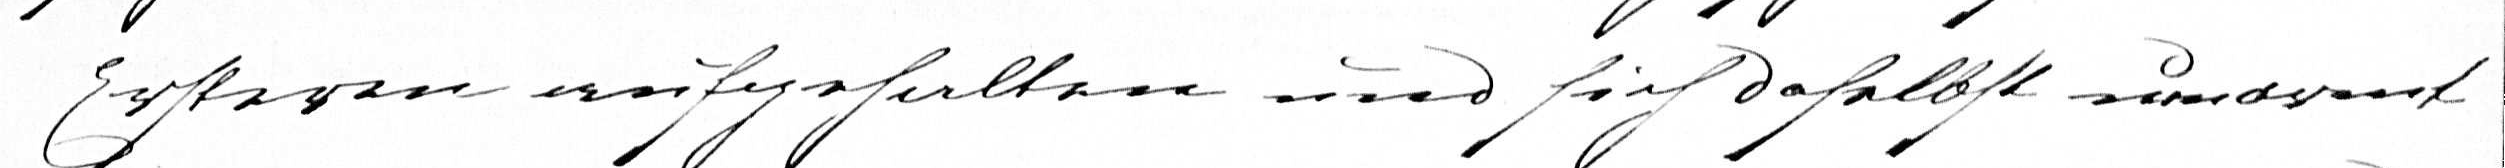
Ersteren aufgehalten und sich daselbst xx
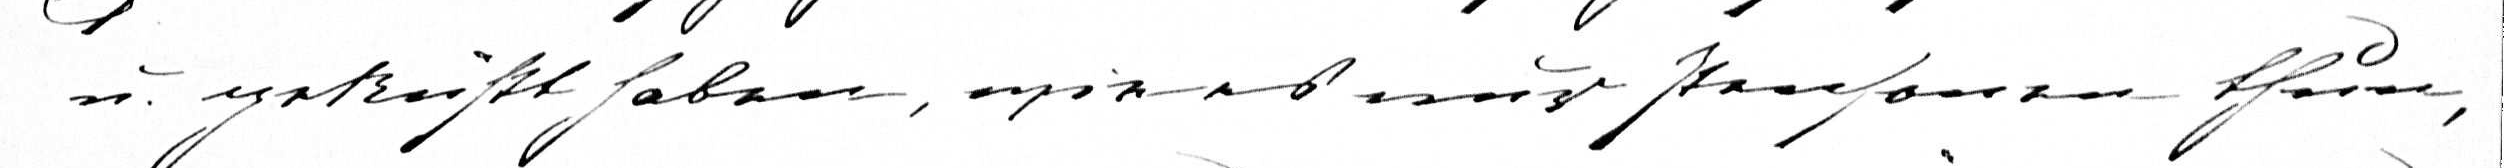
u. geküßt haben, wie es nur Pensonen thun,
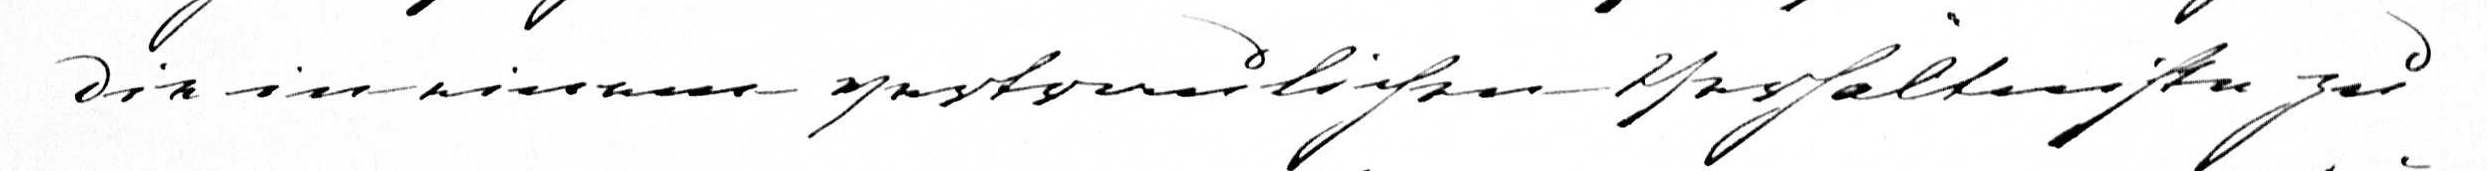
die in einem vertraulichen Verhältniße zu
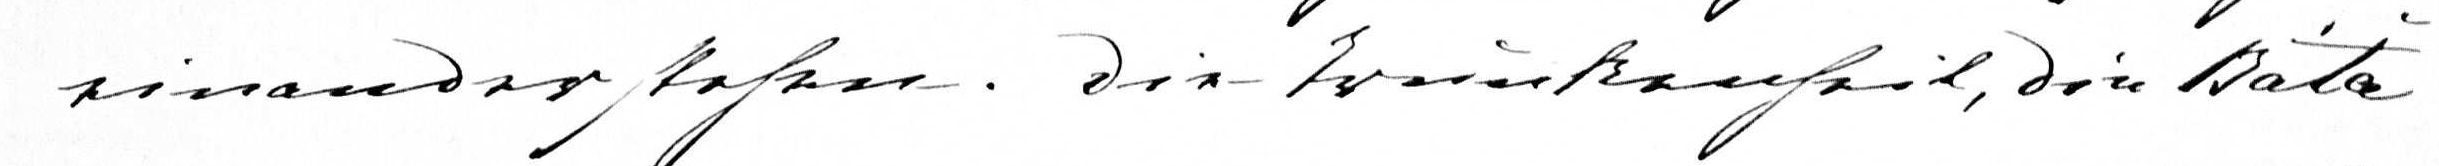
einander stehen. Die Trunkenheit, die Báta
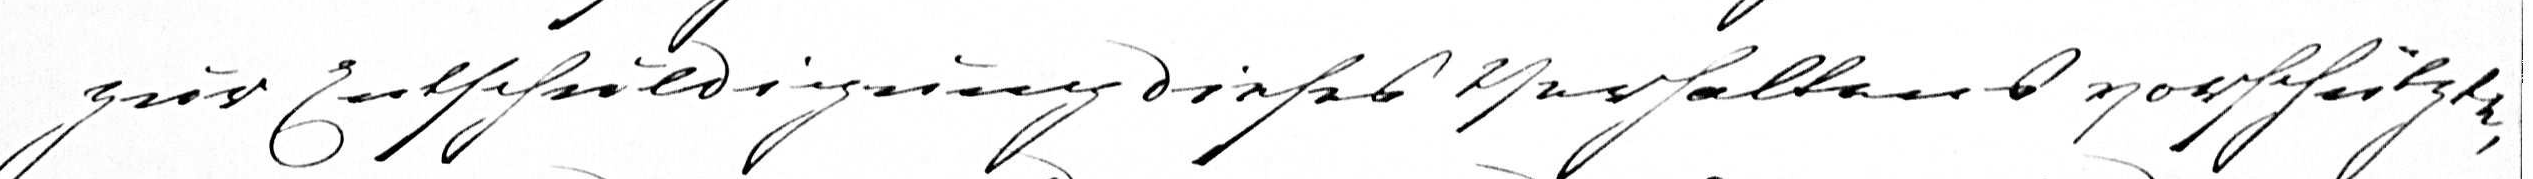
zur Entschuldigung dieses Verhaltens vorschützte,
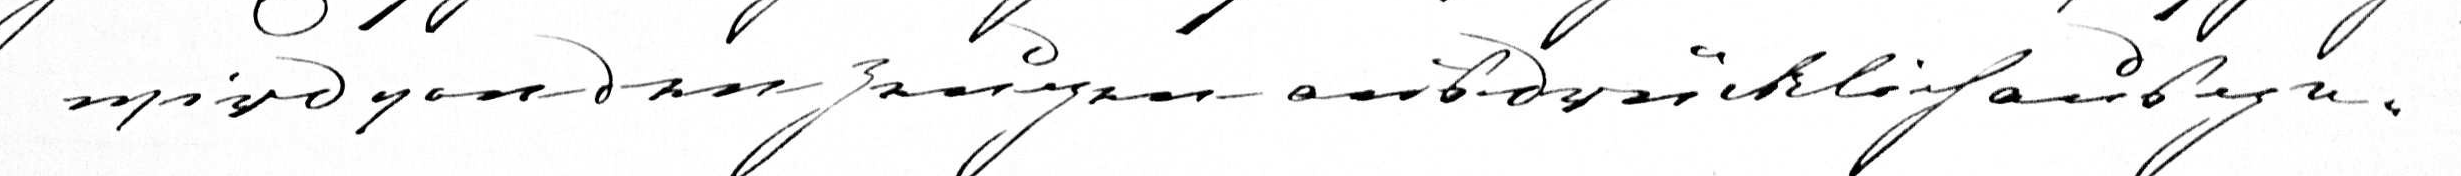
wird von den Zeugen ausdrücklich ausge¬
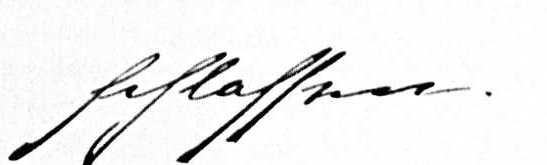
schlossen.
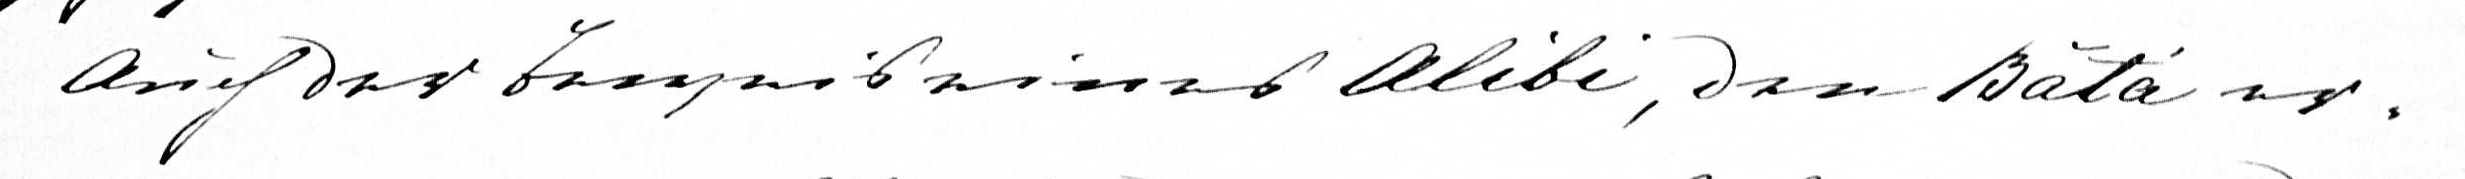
Auch der Beweis eines Alibi, den Báta er¬
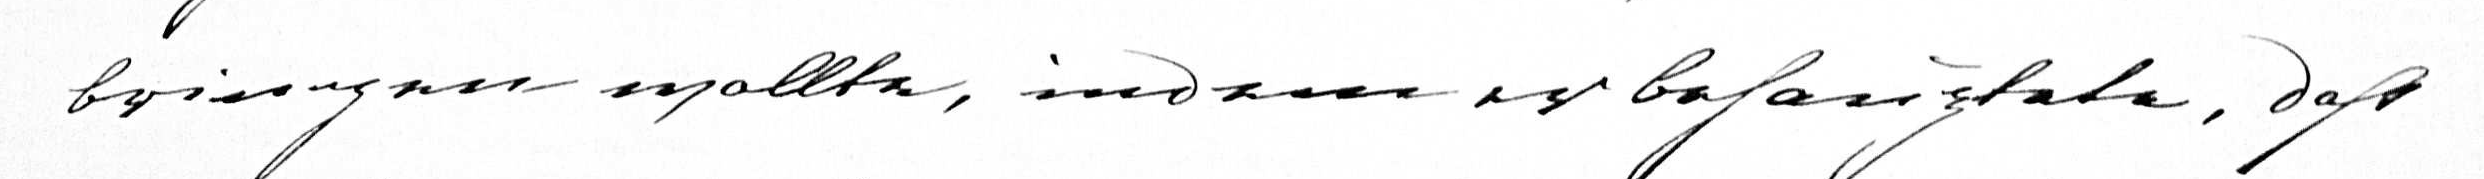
bringen wollte, indem er behauptete, daß
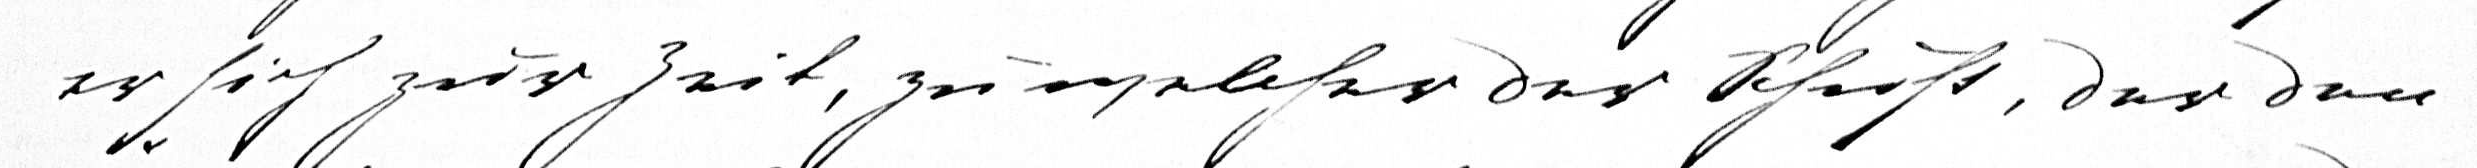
er sich zur Zeit, zu welcher der Schuß, der den
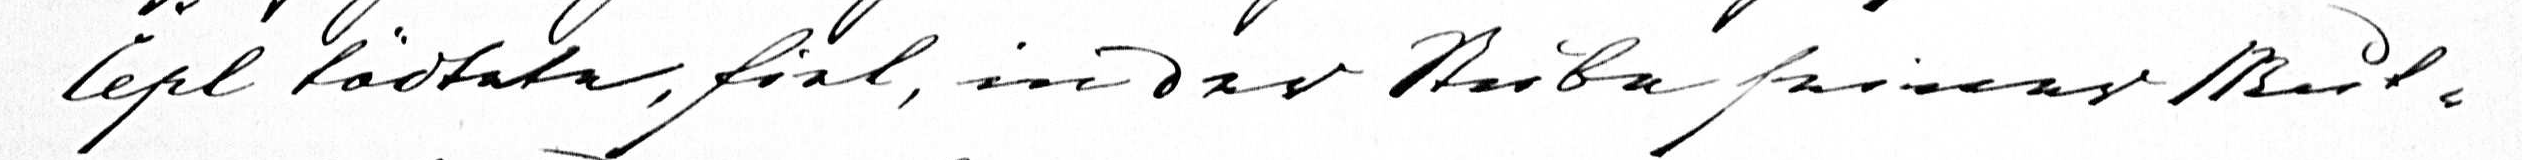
Čepl tödtete, fiel, in der Stube seiner Mut¬
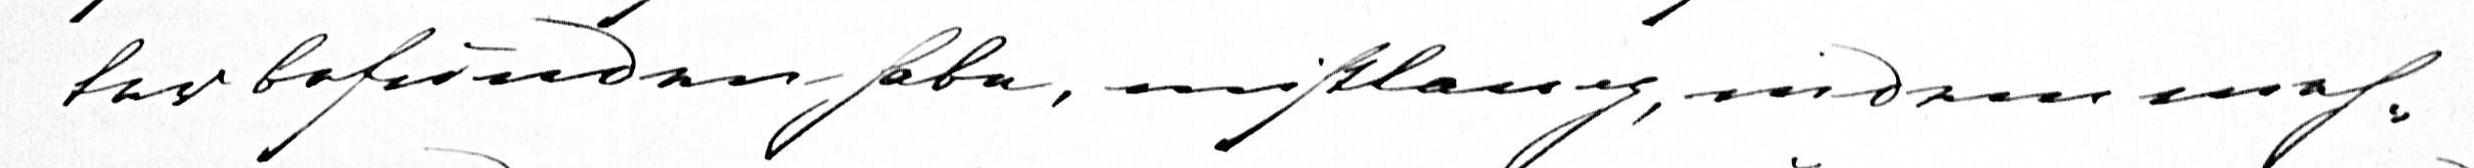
ter befunden habe, mißlang, in dem meh¬
